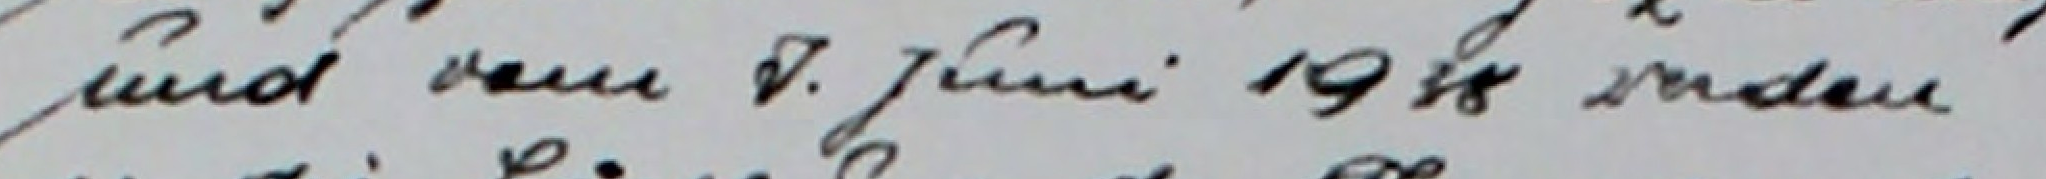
und vom 7. Juni 1938 werden
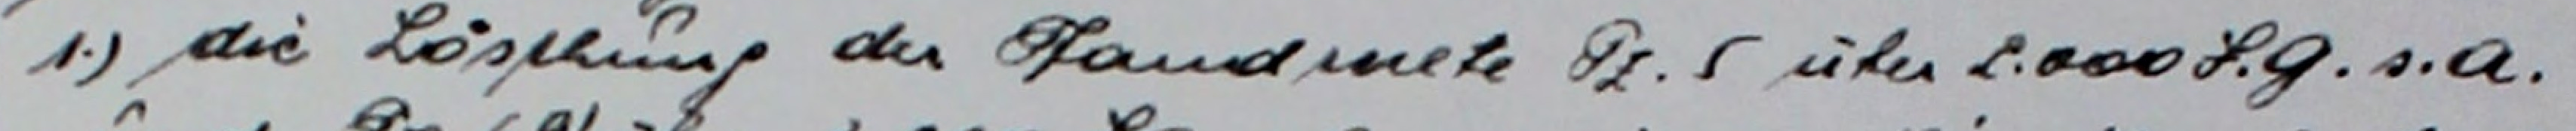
1.) die Löschung der Pfandmete Gz. 5 über 2.000 S.G. s.a.
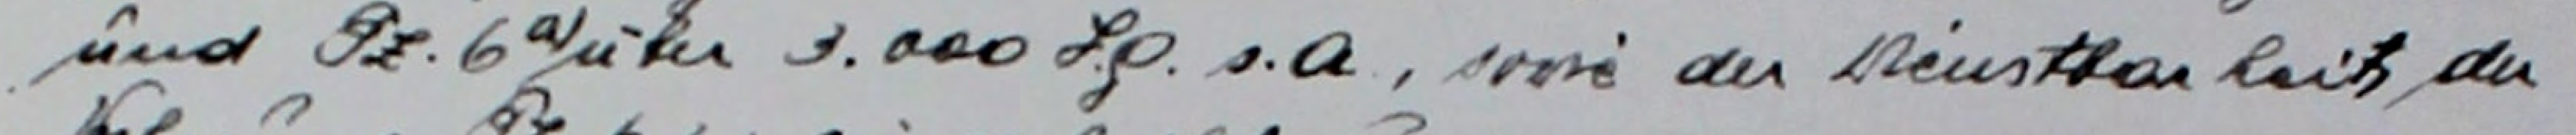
und Gz. 6a) über 3.000 S.G. s.a., sowie der Neustbarkeit der
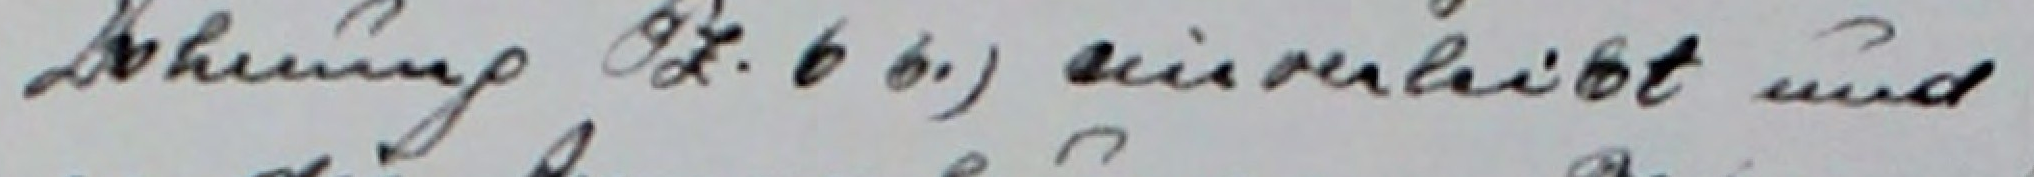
Löschung Gz. 6b.) einverleibt und
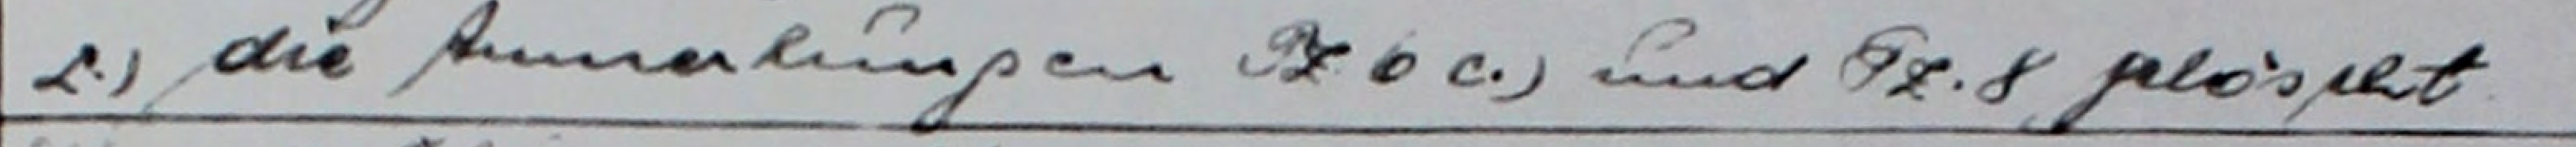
2.) die Anmerkungen Gz. 6c.) und Gz. 8 gelöscht.
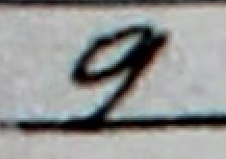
9
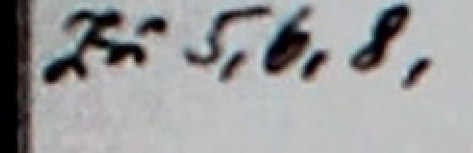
Zu 5, 6, 8,
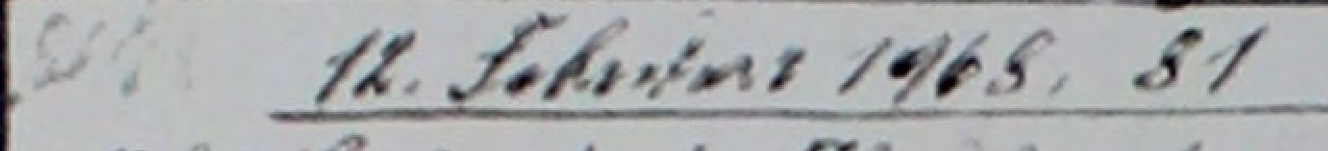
81 12. Februar 1968, 81
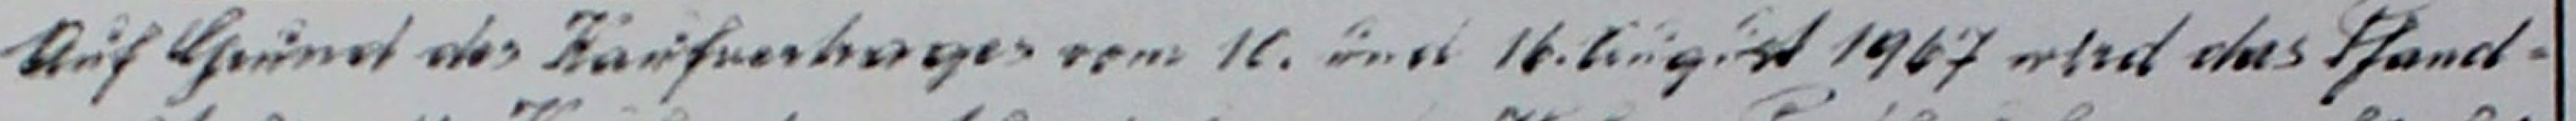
Auf Grund des Kaufvertrages vom 10. und 16. August 1967 wird das Pfand=
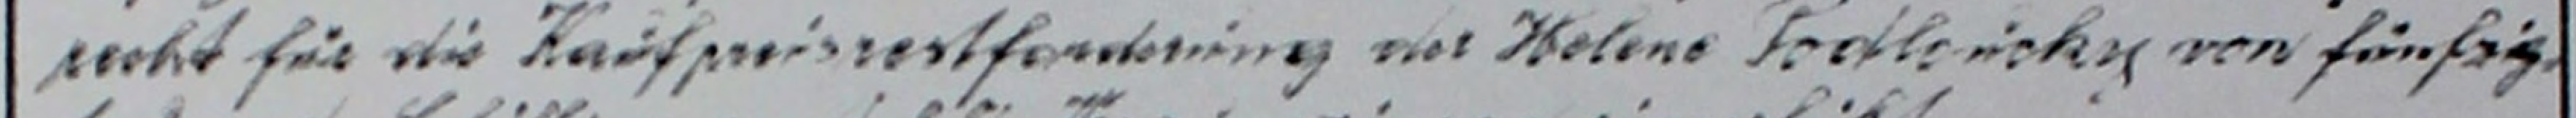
recht für die Kaufpreisrestforderung der Helene Podloucky von fünfzig„
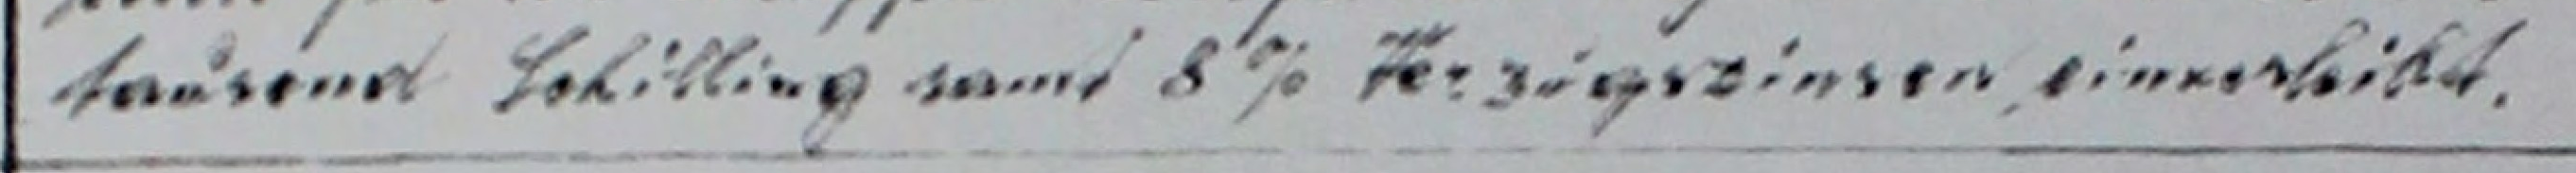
tausend Schilling samt 8 % Verzugszinsen, einverleibt.
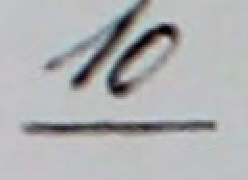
10
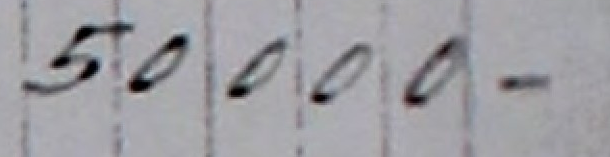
50000 -
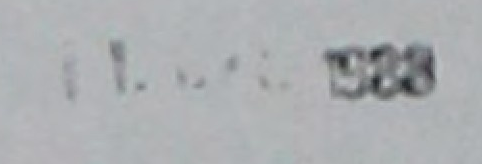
??? 1988
